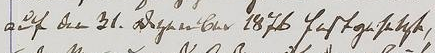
auf den 31. Dezember 1876 festgesetzt,
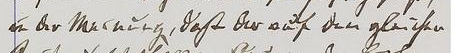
in der Meinung, daß der auf den gleichen
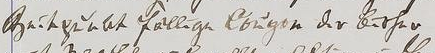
Zeitpunkt fällige Coupon der bisher
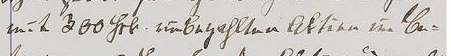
mit 300 Frk. einbezahlten Aktien im Be-
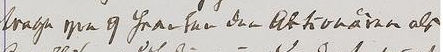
trage von 9 Franken den Aktionären als
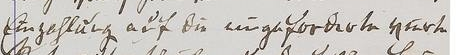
Einzahlung auf die eingeforderte vierte
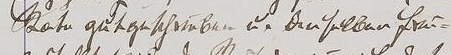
Rate gutgeschrieben u. denselben frei-
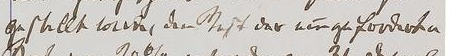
gestellt werde, den Wert der eingeforderten
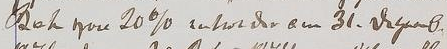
Rate von 20% entweder am 31. Dezemb.
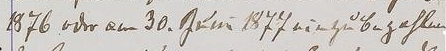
1876 oder am 30. Juni 1877 einzubezahlen.
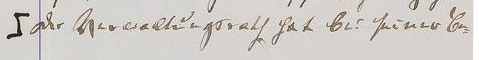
Der Verwaltungsrath hat bei seiner Be-
